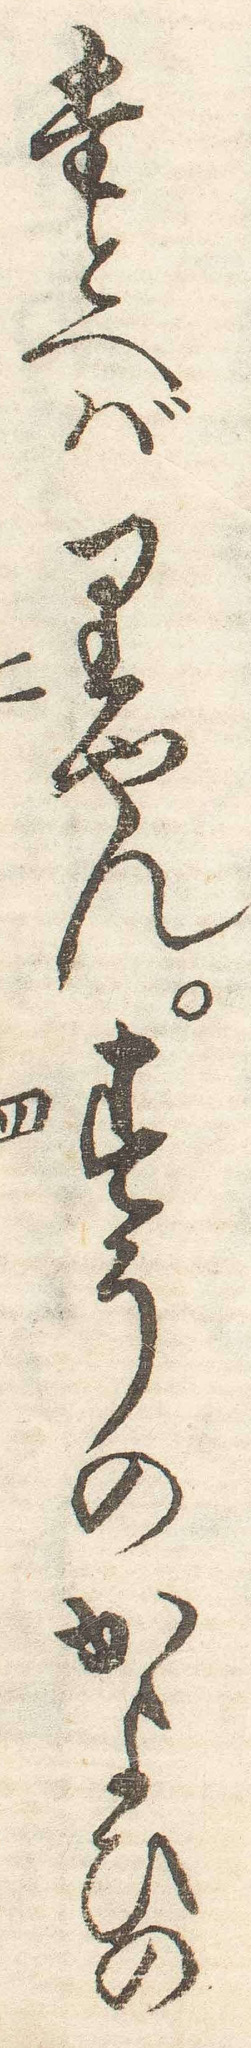たとへばりやん。すうのかよひの

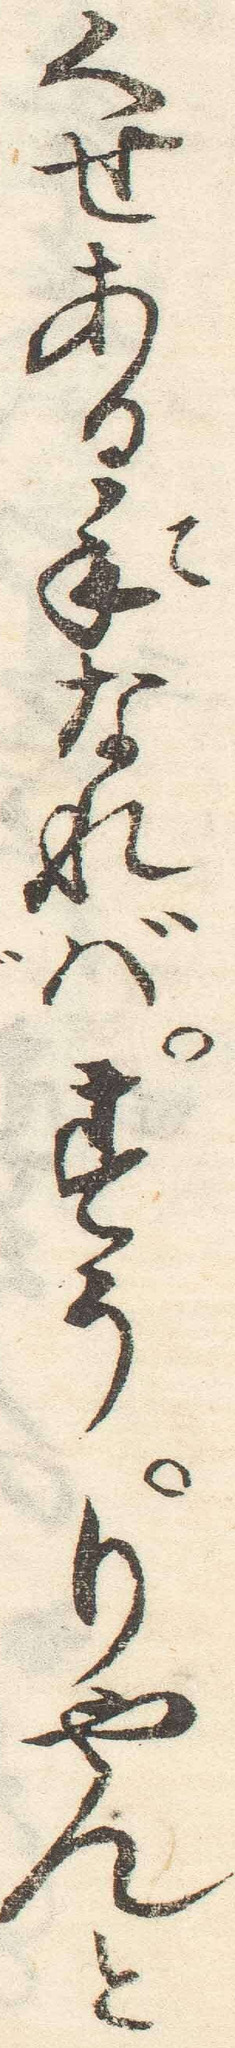くせある手なれば。すう。りやんと
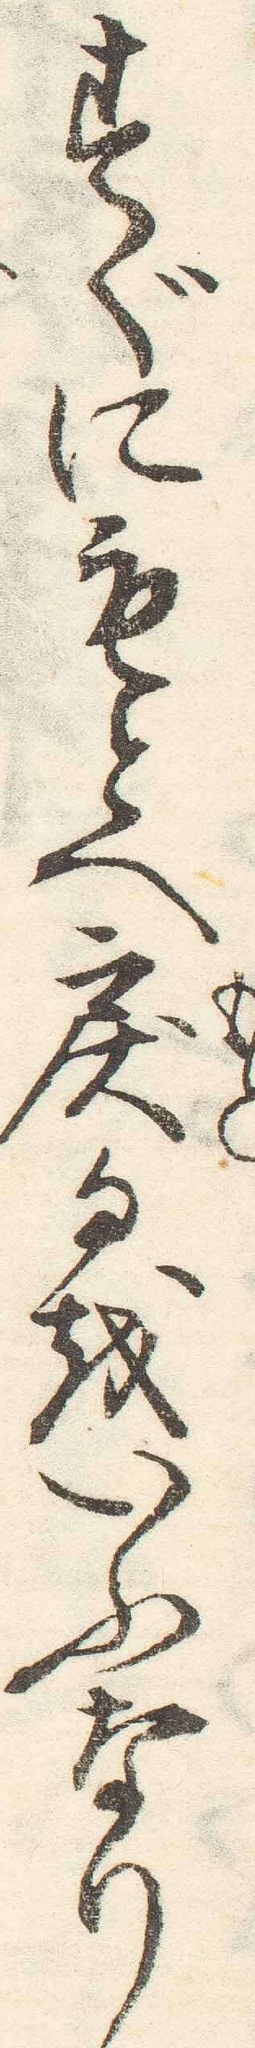すぐにもとへ戻るをいふなり
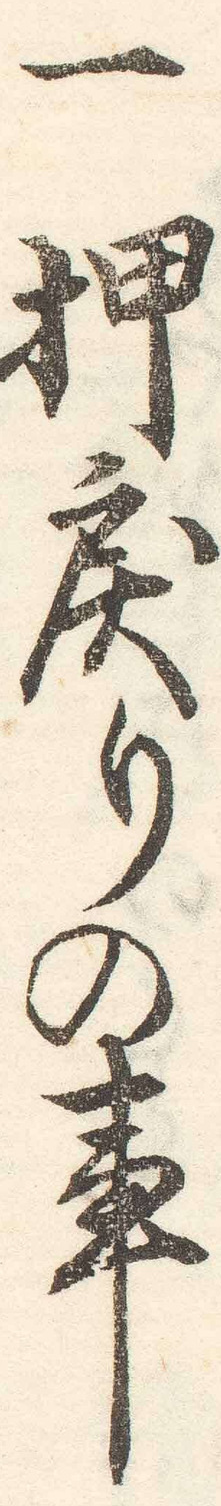一押戻りの事
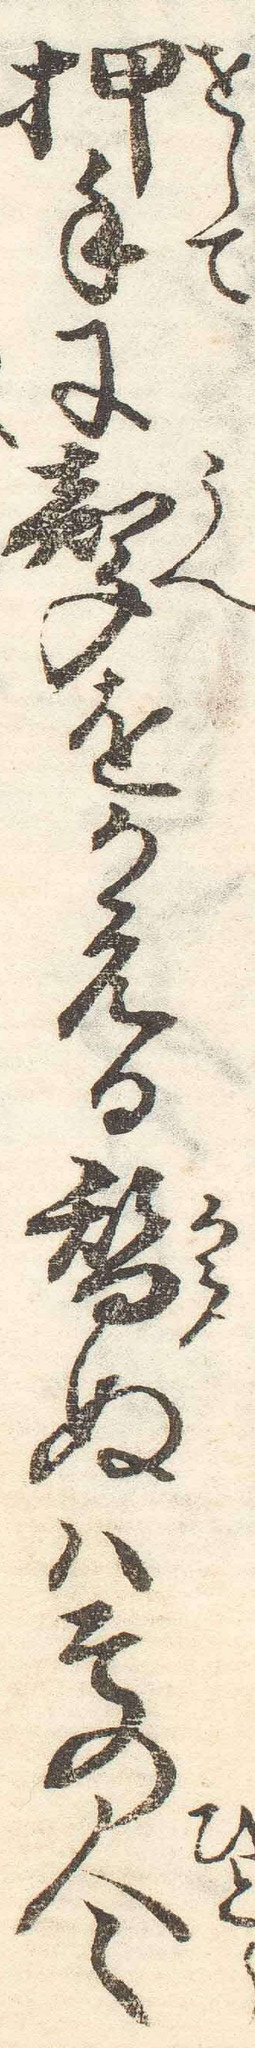押手に声をかえる替ぬはその人々
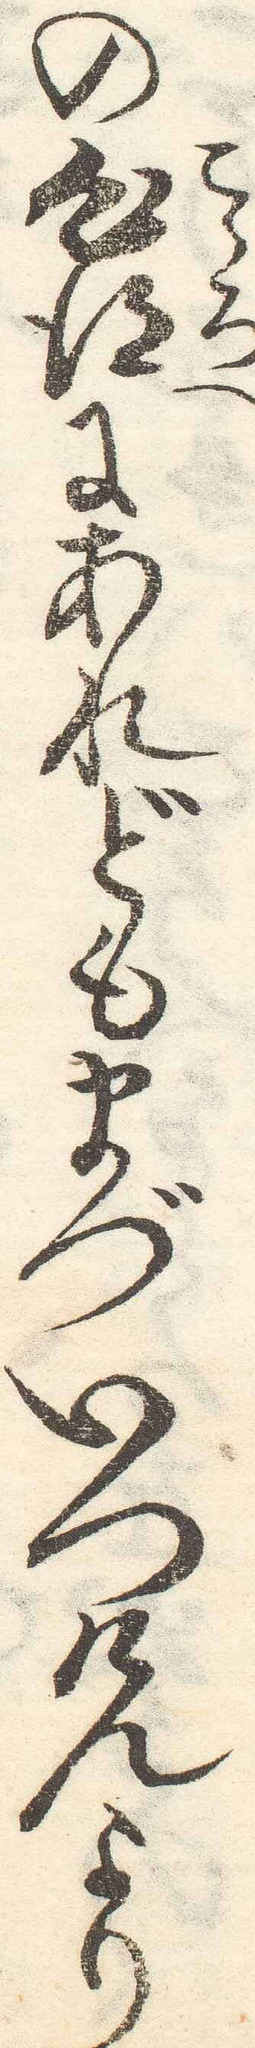の心得にあれどもまづいつけんより
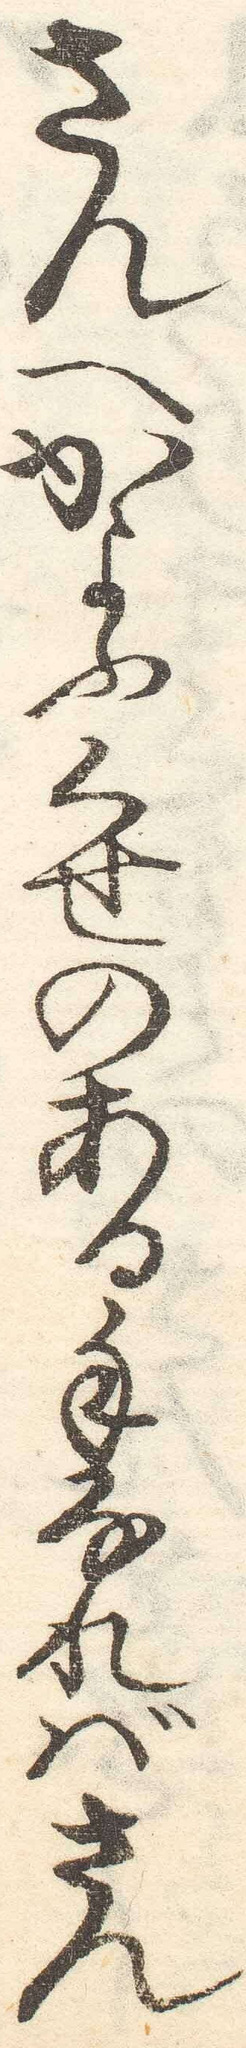さんへかよふくせのある手なればさん
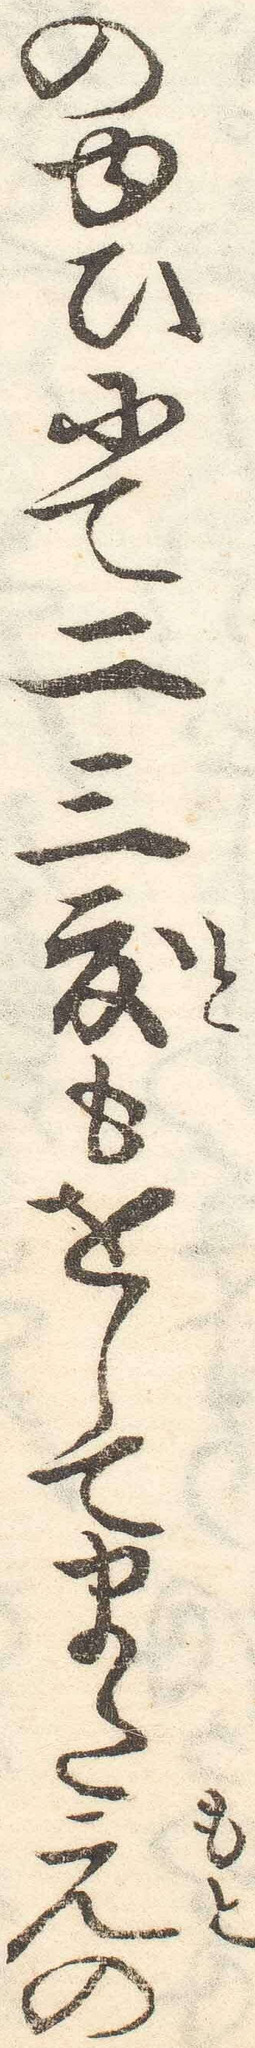のゆひにて二三度もをしてまた元の
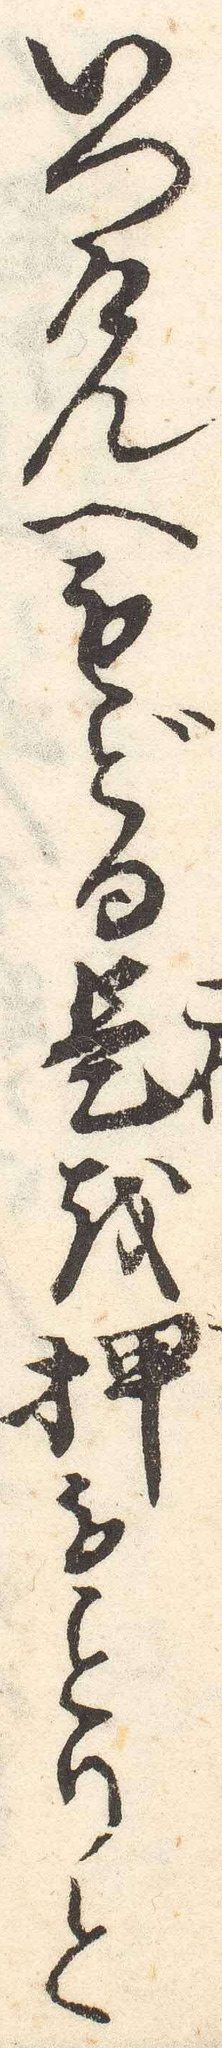いつけんへもどる是を押もとりと
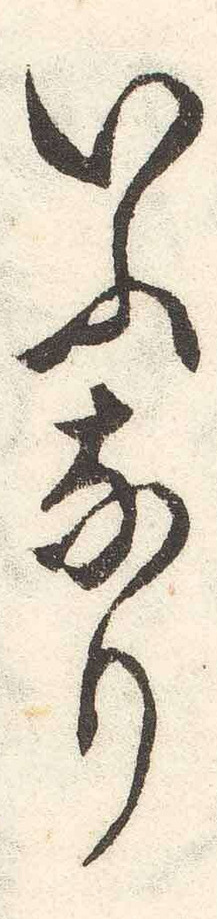いふなり
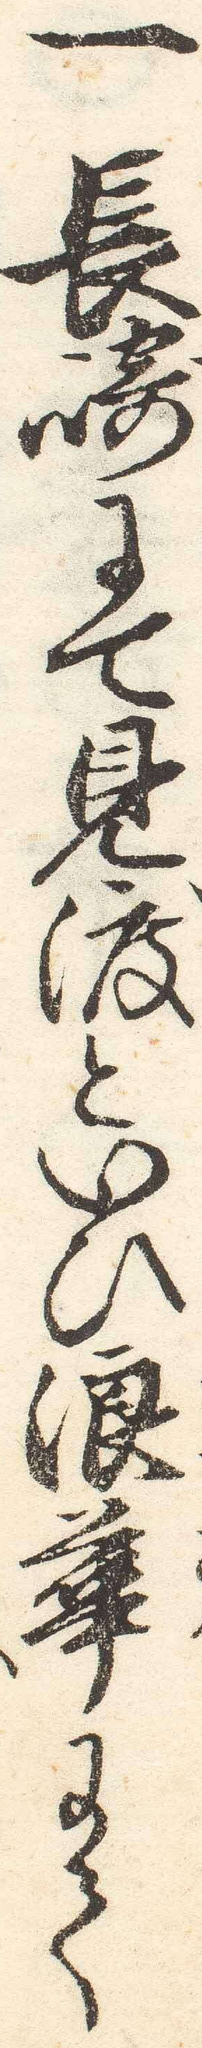一長崎にて見渡といひ浪華にて
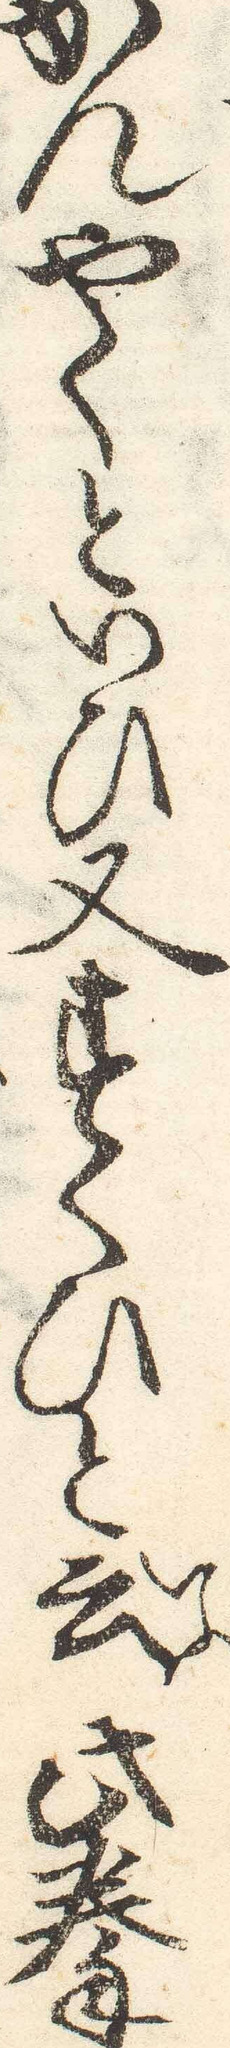かんやくといひ又すくひと云此拳
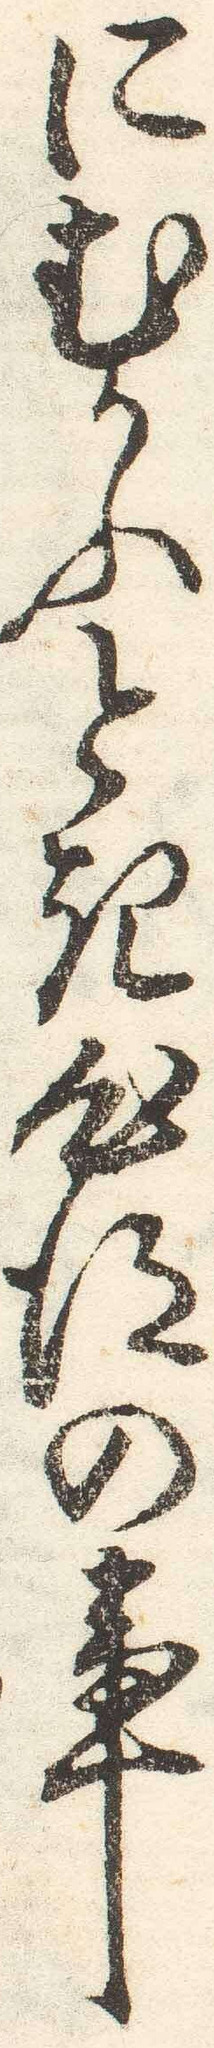にむかふとき心得の事
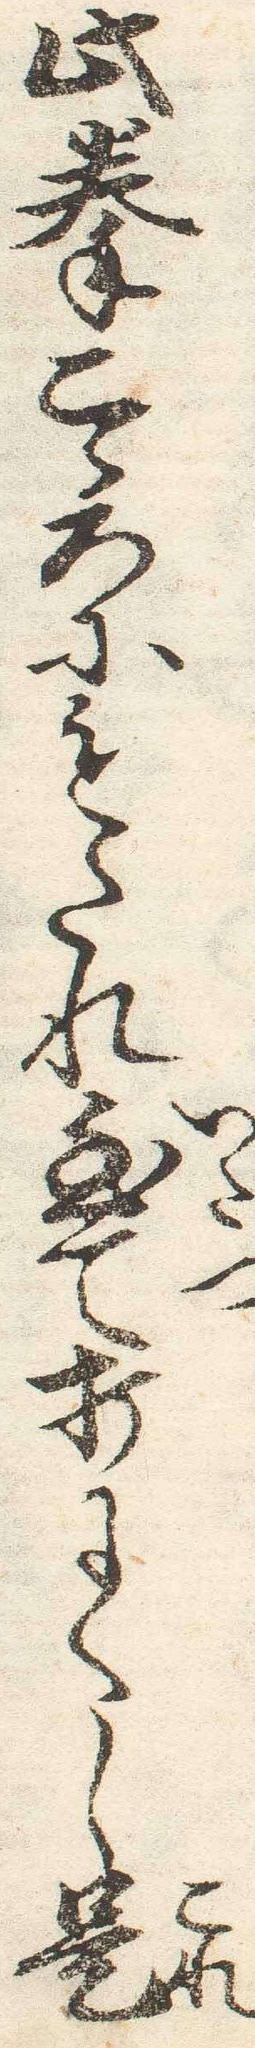此拳こゝろにもたれ至て打にくし是
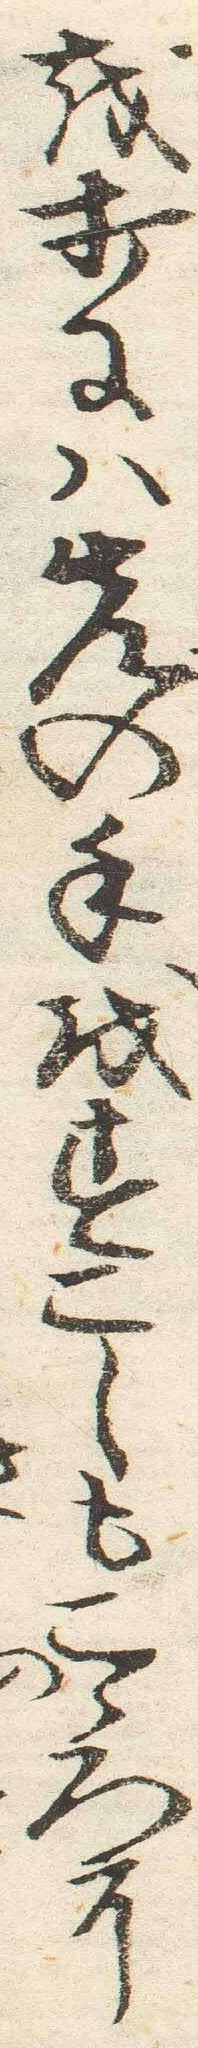を打には先の手をすこしもこゝろに
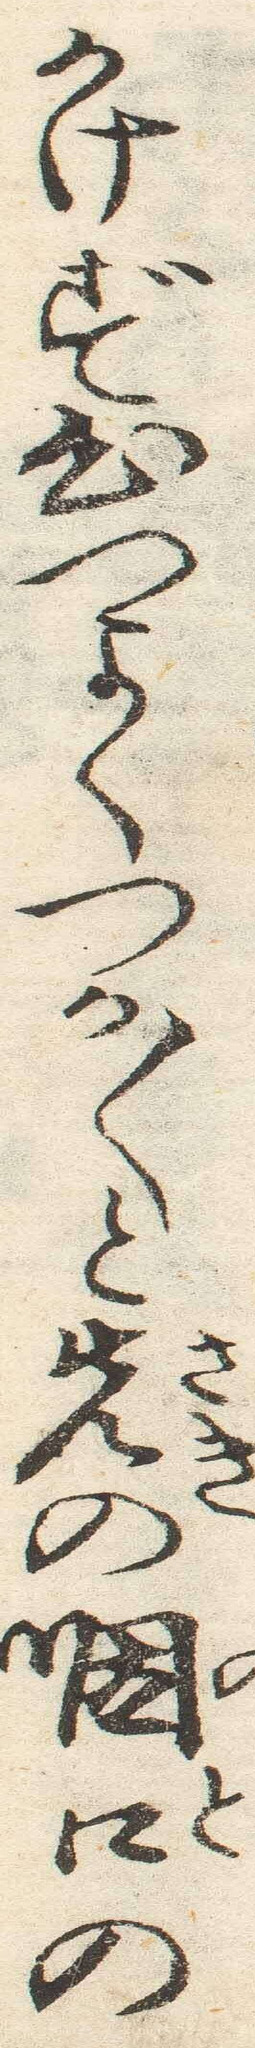かけず心つよくつか〳〵と先の咽口の
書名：拳独稽古
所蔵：東京学芸大学附属図書館 国文学研究資料館
